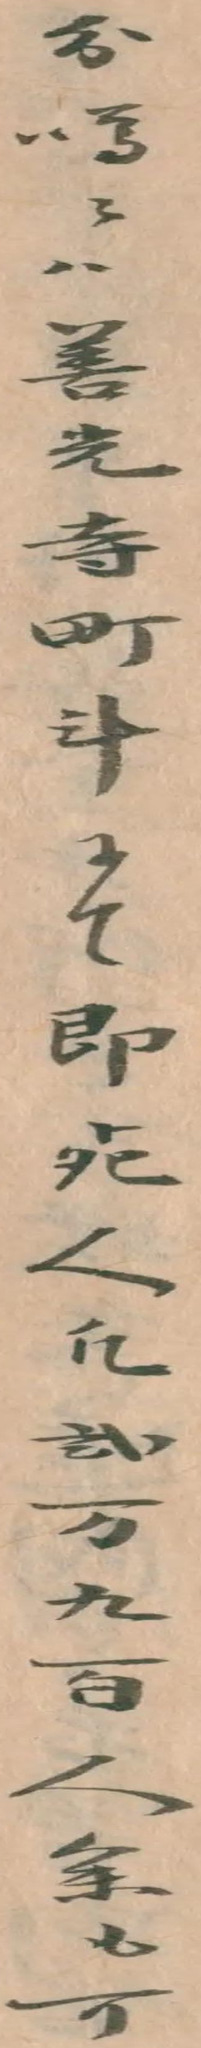分噂ニハ善光寺町計にて即死人凡弐万九百人余も可
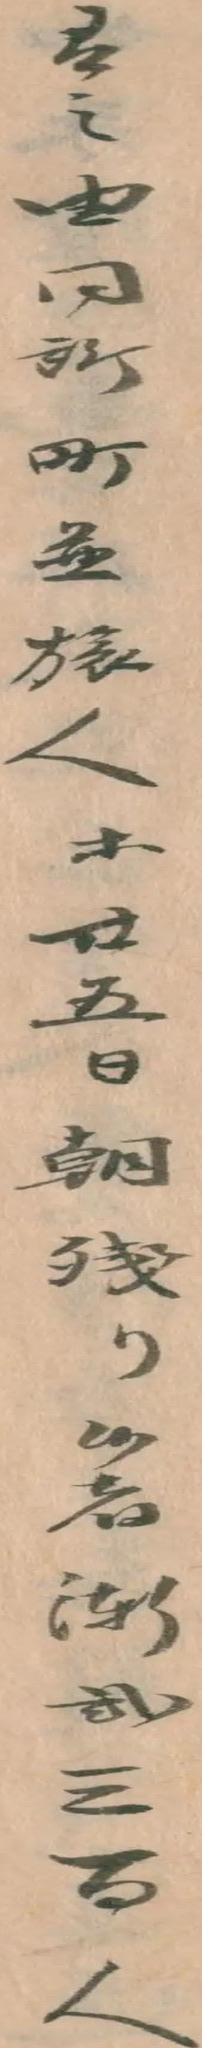有之由同所町並旅人等廿五日朝残り候者漸弐三百人
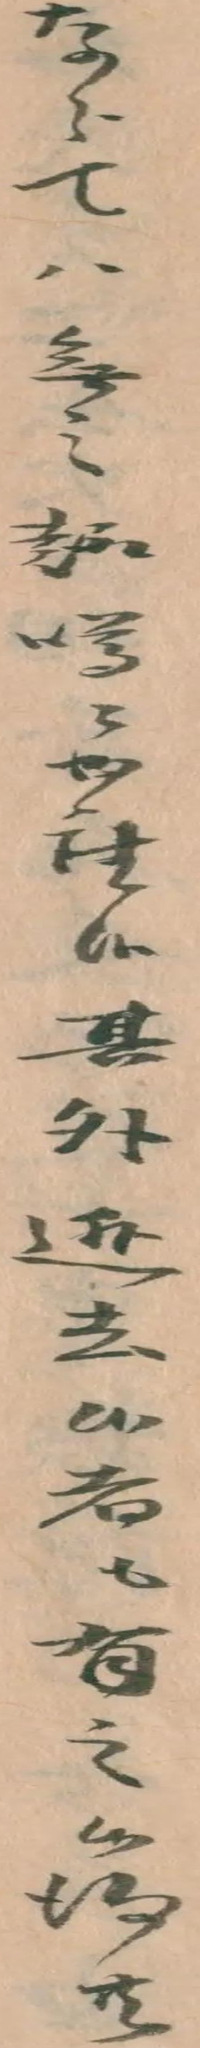ならてハ無之趣噂二御座候其外逃去候者も有之候得共
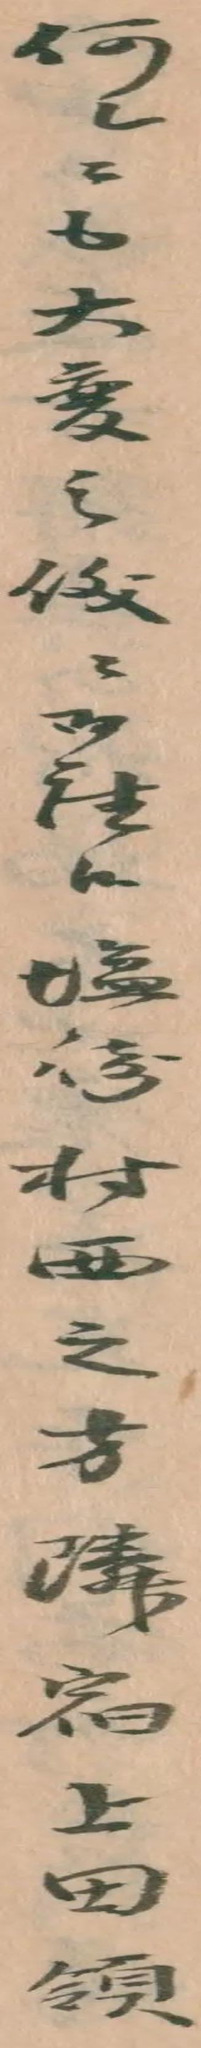何レ二も大変之儀ニ御座候塩崎村西之方隣宿上田領
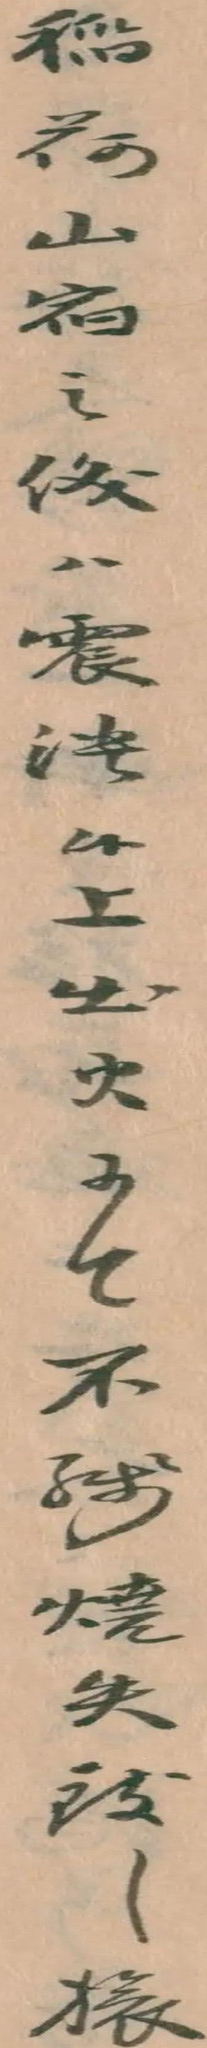稲荷山宿之儀ハ震潰候上出火にて不残焼失致し旅
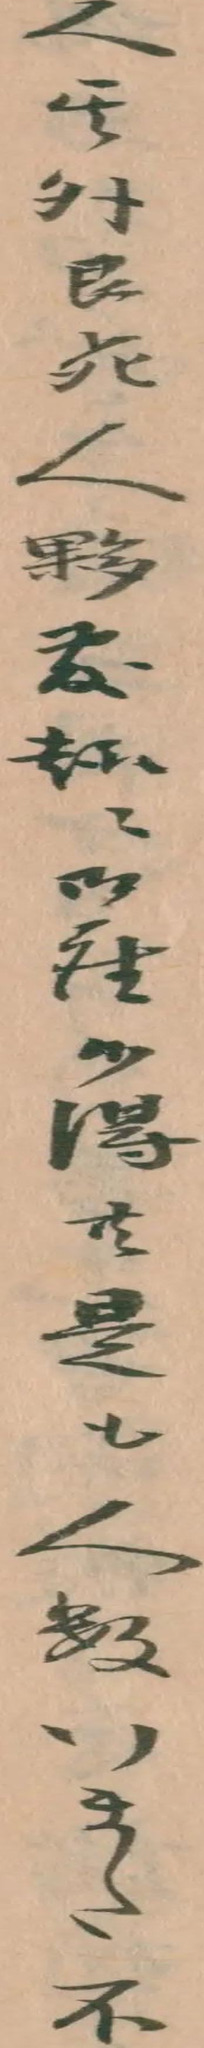人其外即死人夥敷趣ニ御座候得共是も人数いまだ不
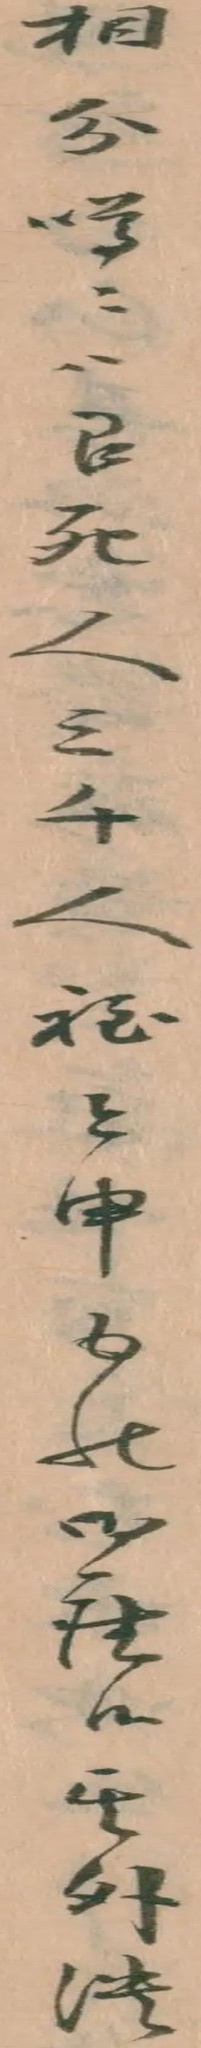相分噂ニハ即死人三千人程と申もの御座候其外潰
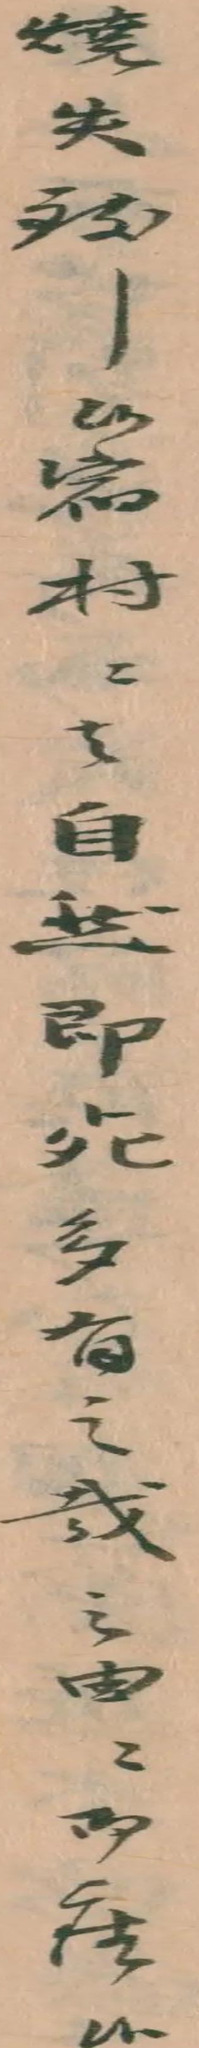焼失致し候宿村々自然即死多有之哉之由二御座候
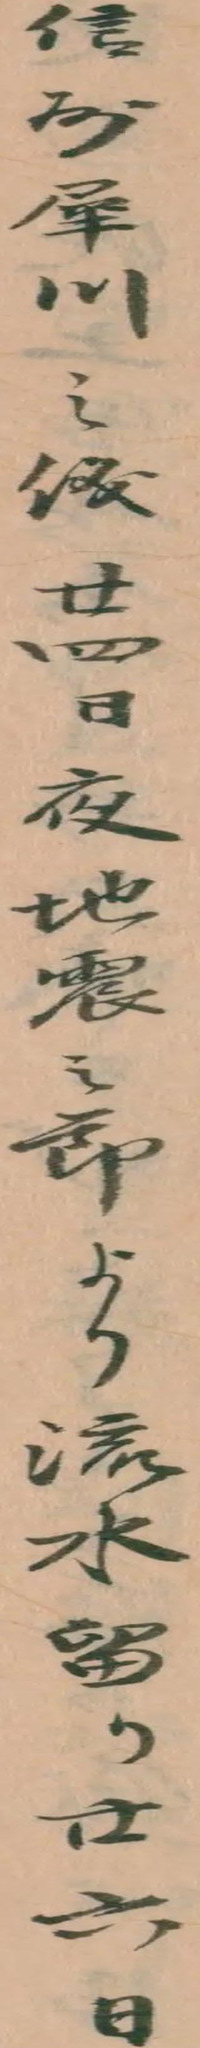信州犀川之儀廿四日夜地震之節より流水留り廿六日
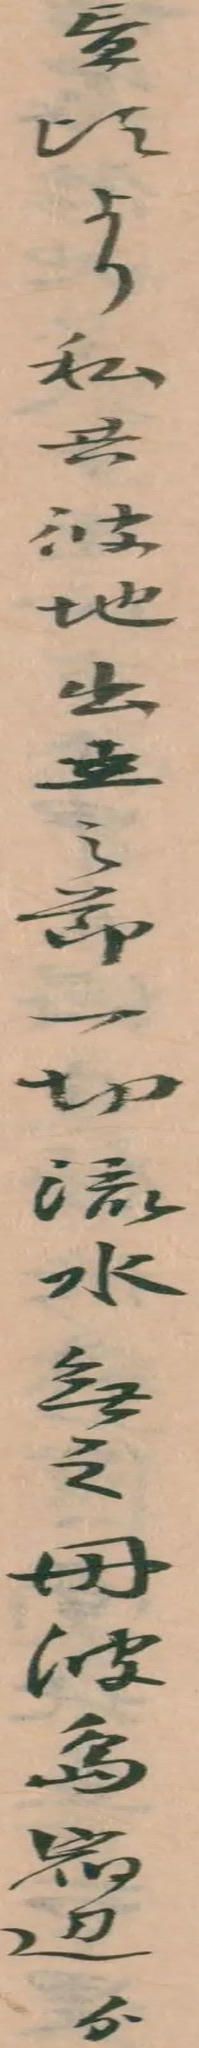昼比より私共彼地出立之節一切流水無之丹波島宿辺ゟ
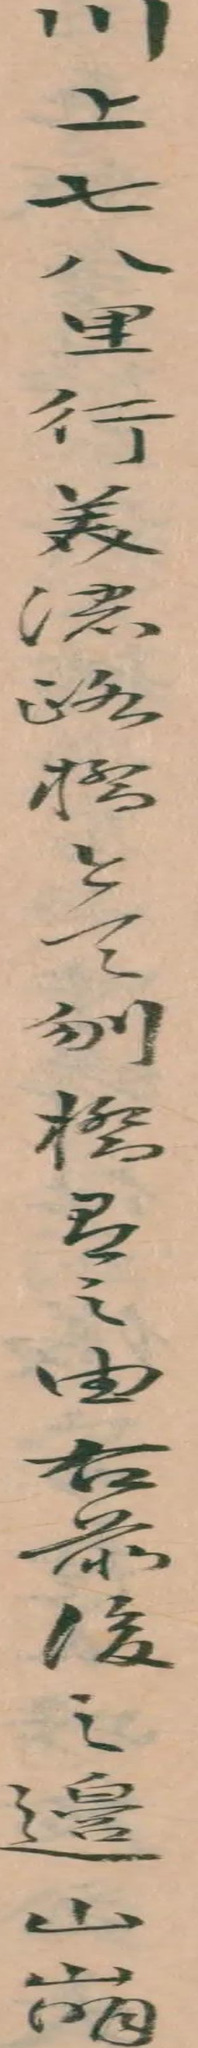川上七八里行美濃路橋とて刎橋有之由右前後之辺山崩
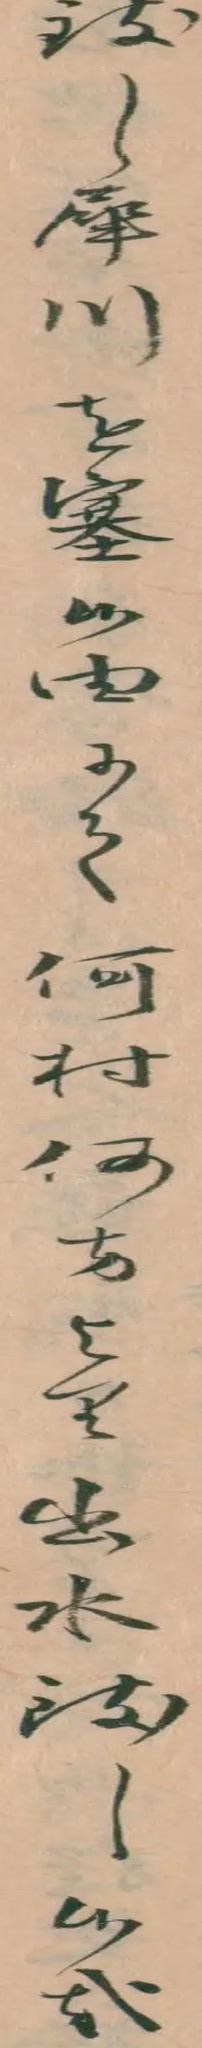致し犀川を塞候由にて何村何方より出水致し候哉
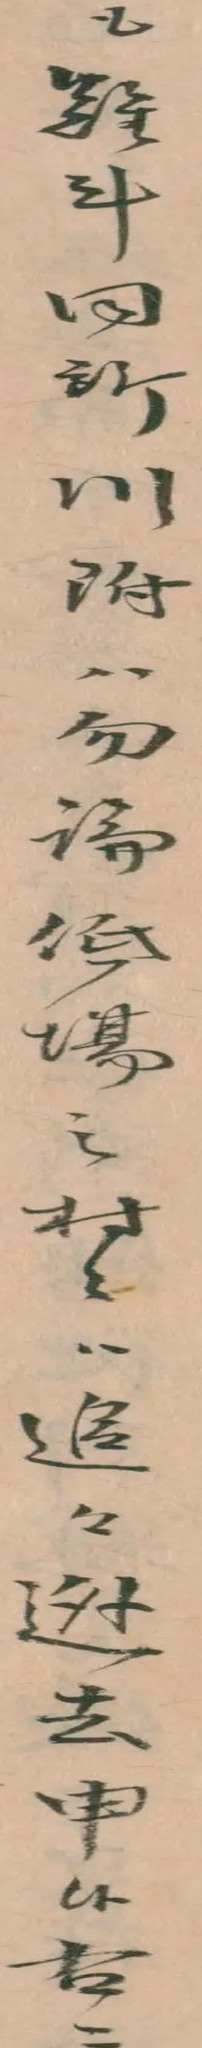も難計同所川附ハ勿論低場之村々ハ追々逃去申候右ニ
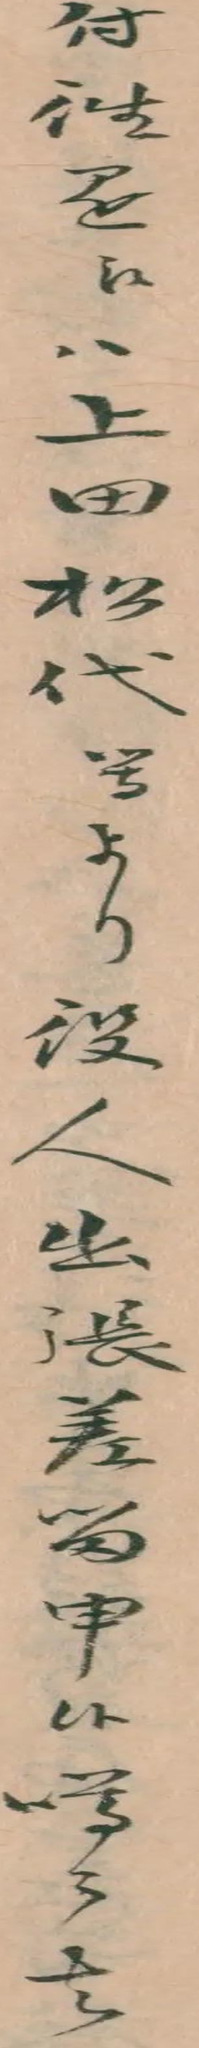付往還江ハ上田松代等より役人出張差留申候噂ニ者
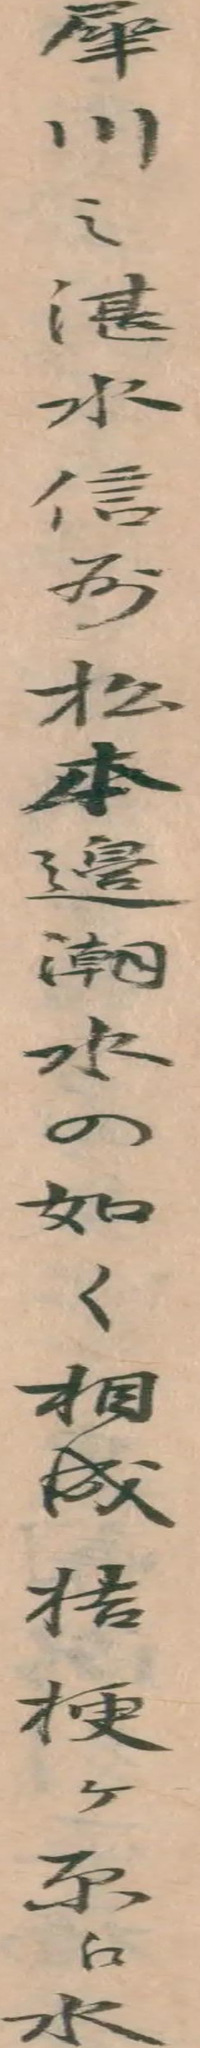犀川之湛水信州松本辺潮水の如く相成桔梗ケ原江水
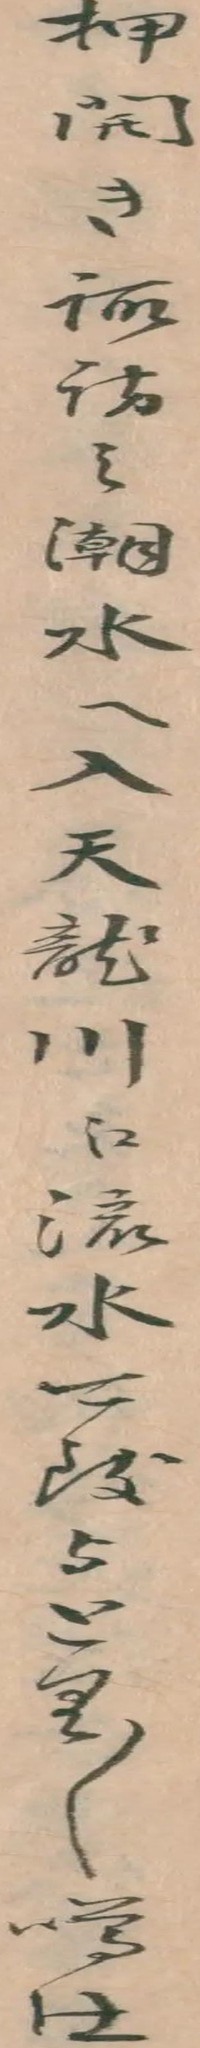押開き諏訪之潮水江入天龍川江流可致ととり〳〵噂仕
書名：地災撮要. 巻3(地震之部)-巻4(噴火之部)
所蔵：国立国会図書館 National Diet Library, JAPAN
